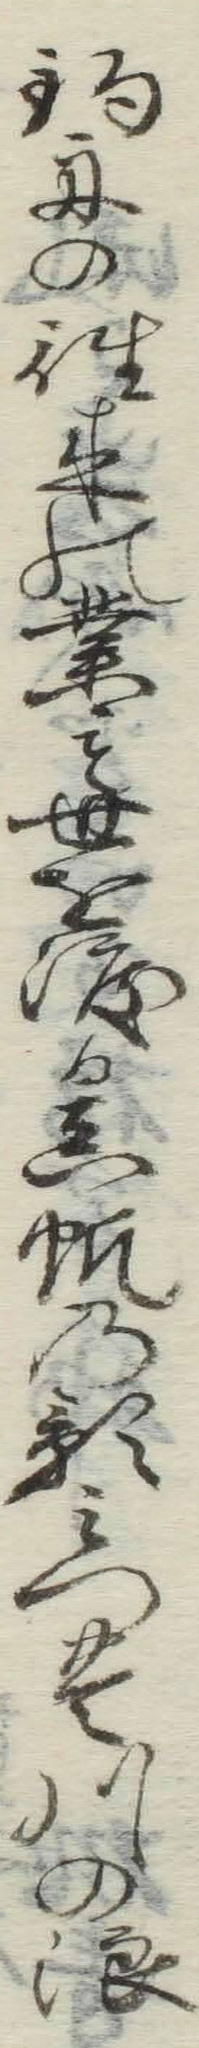釣舟の往来の業を世を渡る真帆の影みつ豊川の浪
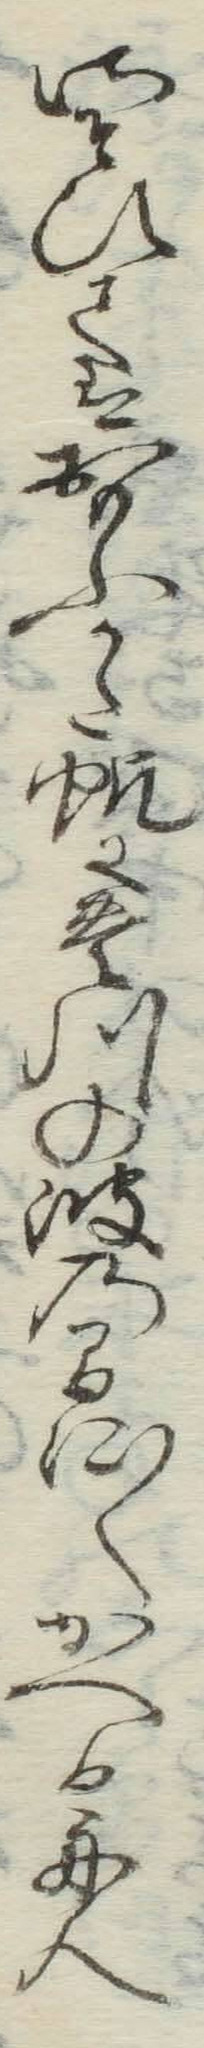さそひてはおもふかた帆に豊川の波の間に〳〵かへる舟人
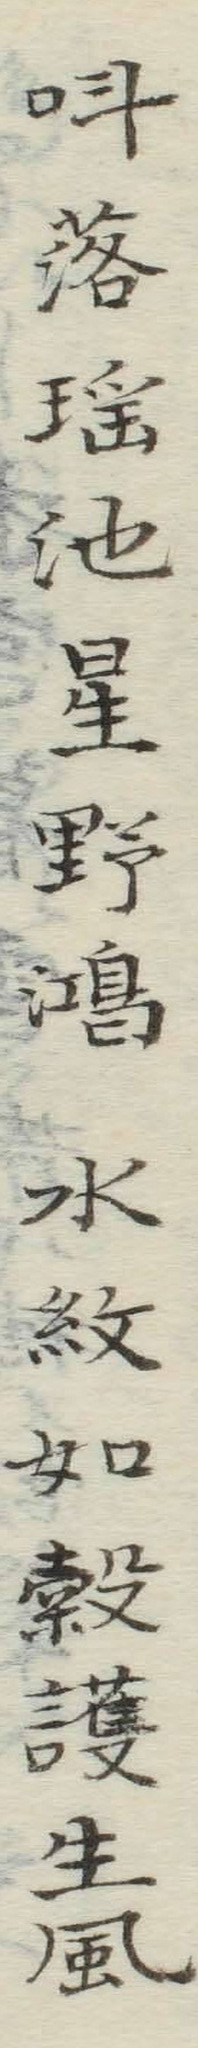叫落瑶池星野鴻水紋如穀護生風
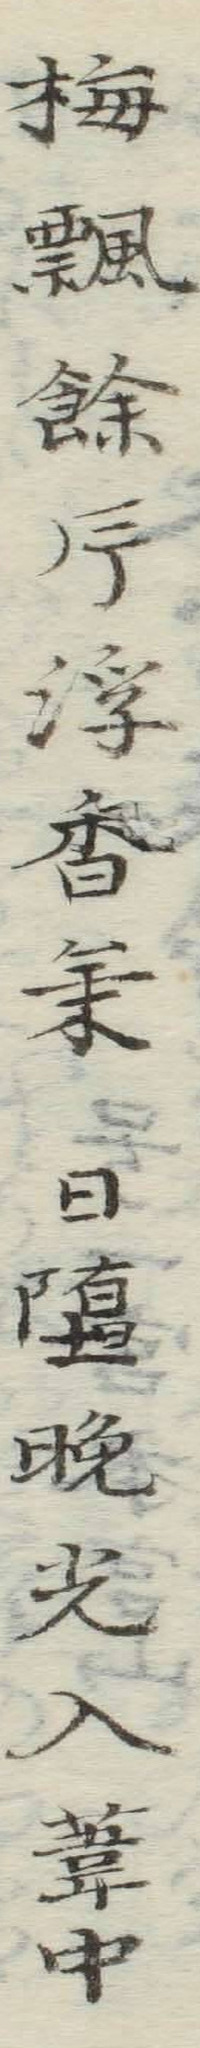梅漂余片浮香気日堕晩光入葦中
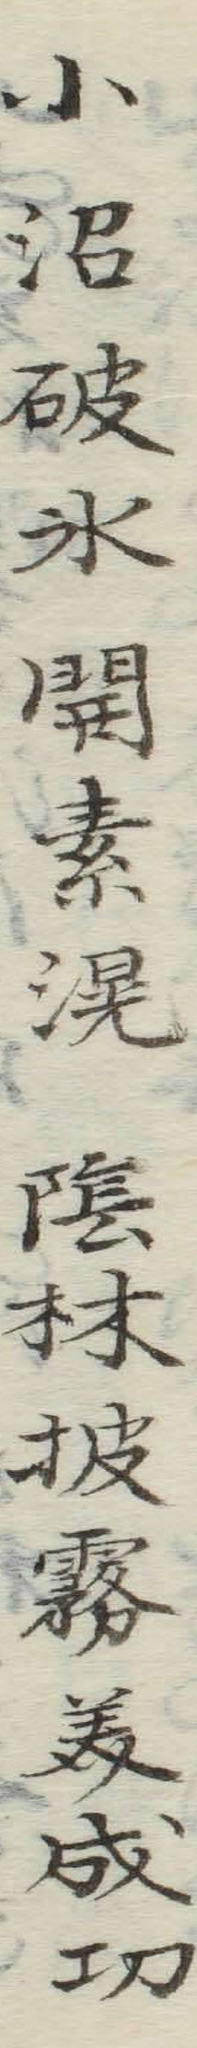小沼破氷開素滉陰林披霧美成功
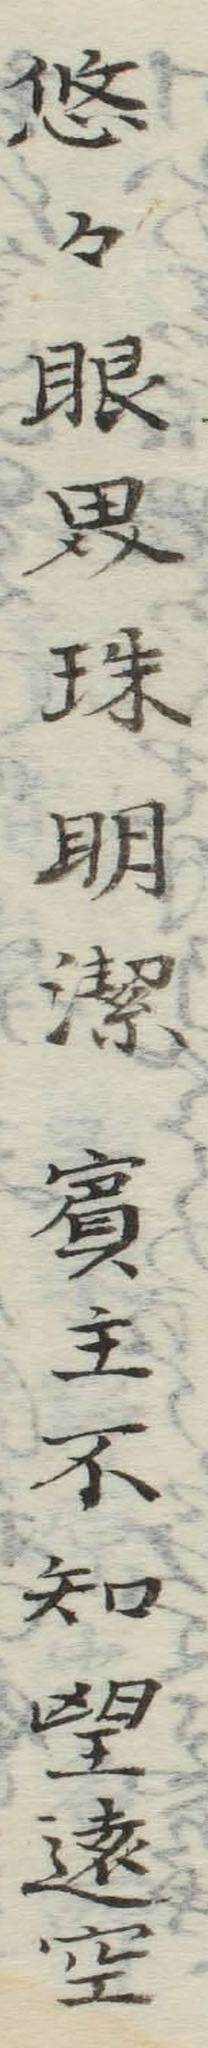悠々眼界珠明潔賓主不知望遠空
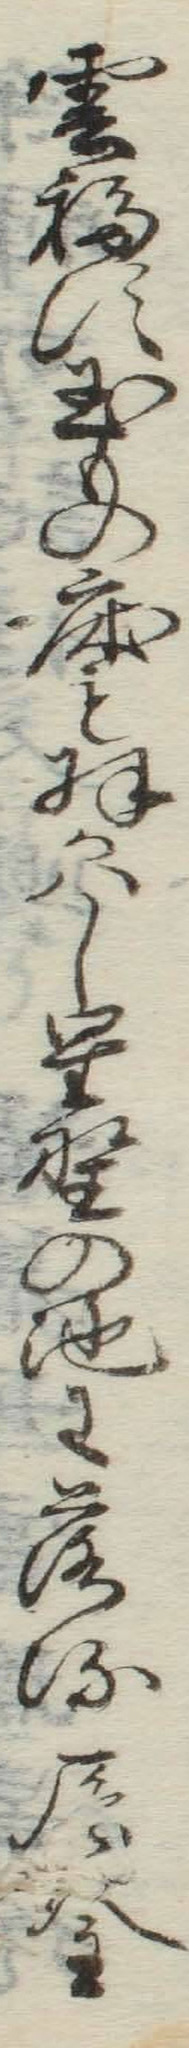雲移す玉もの床も羽かはし星野の池に落る雁金
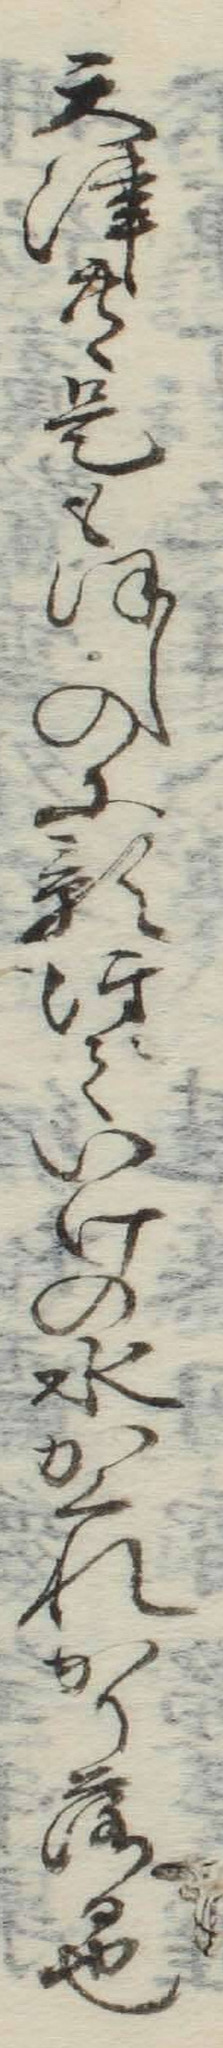天津雲是もほしのに影冴ていけの水かくれかり落る也

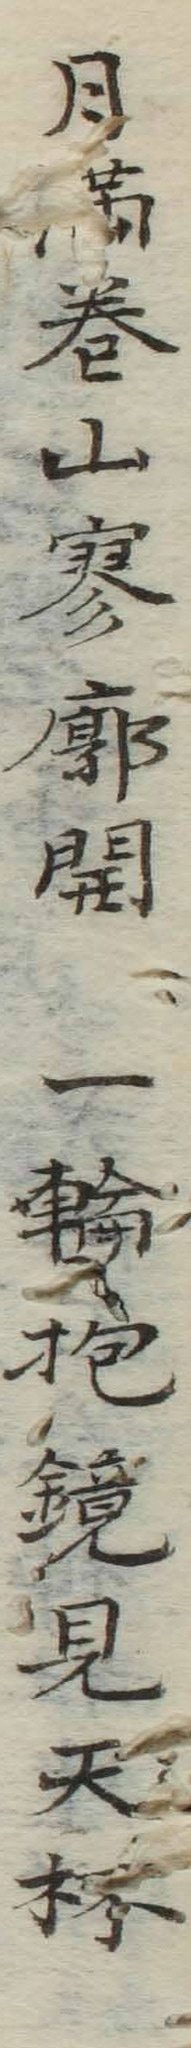月満巻山寥廓開一輪抱鏡見天杯
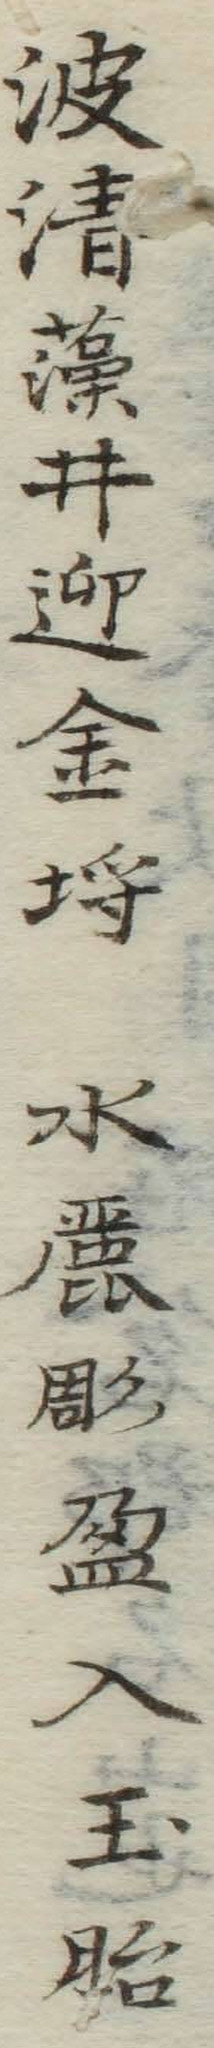波清藻井迎金埒水麗彫盈入玉胎
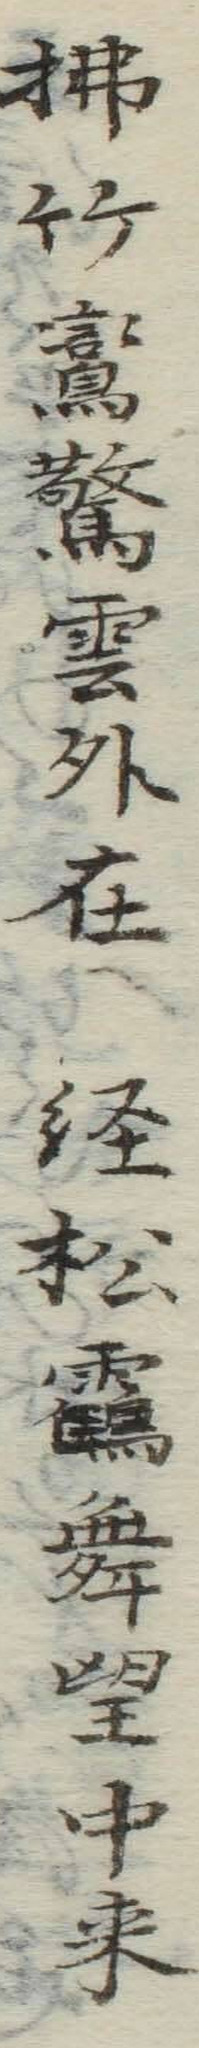拂竹鸞驚雲外在経松鶴舞望中来
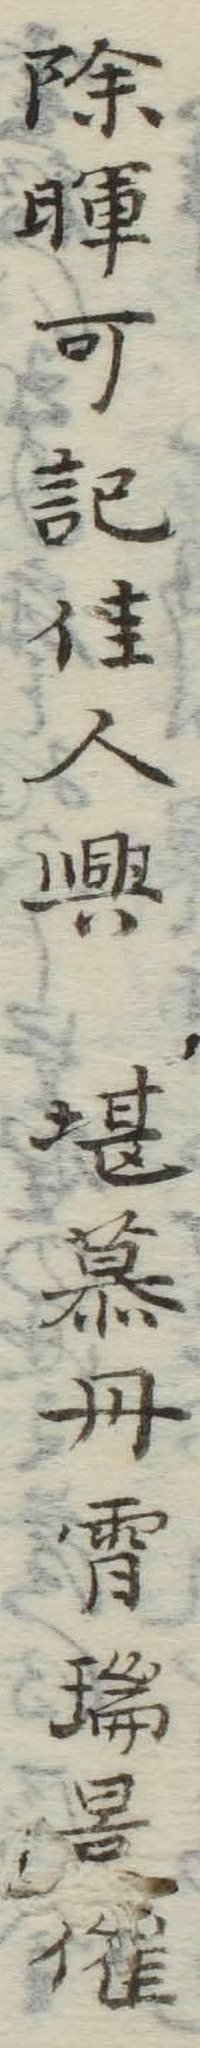除暉可記佳人興堪慕丹𫕟瑞景催
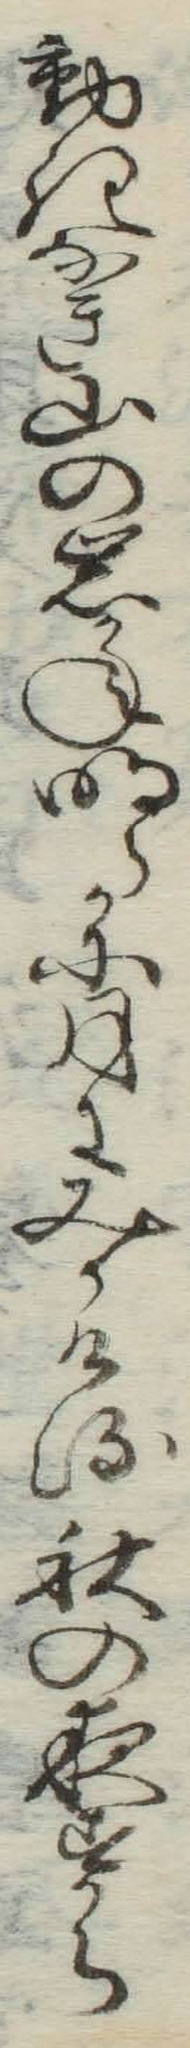動きなき山の岩かね明らかに月にみかける秋の夜すから
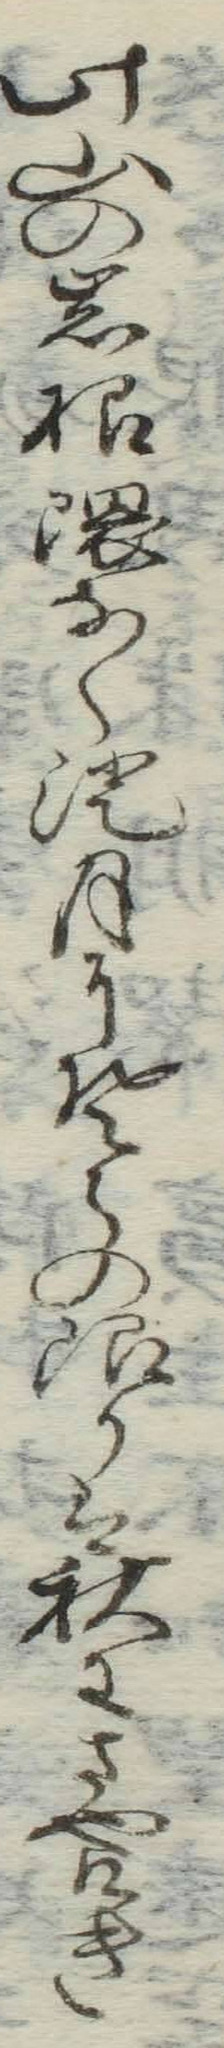此山の岩根隈なく澄月にそらの限りは秋にさやけき
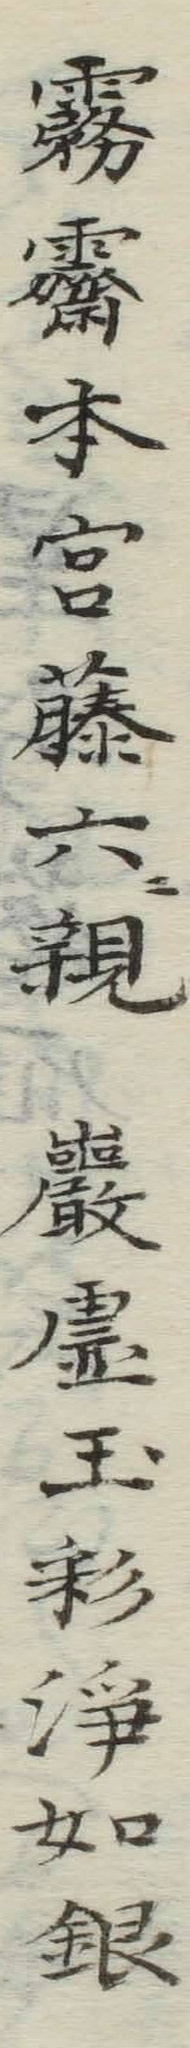霧霽本宮藤六親巌虚玉彩浄如銀
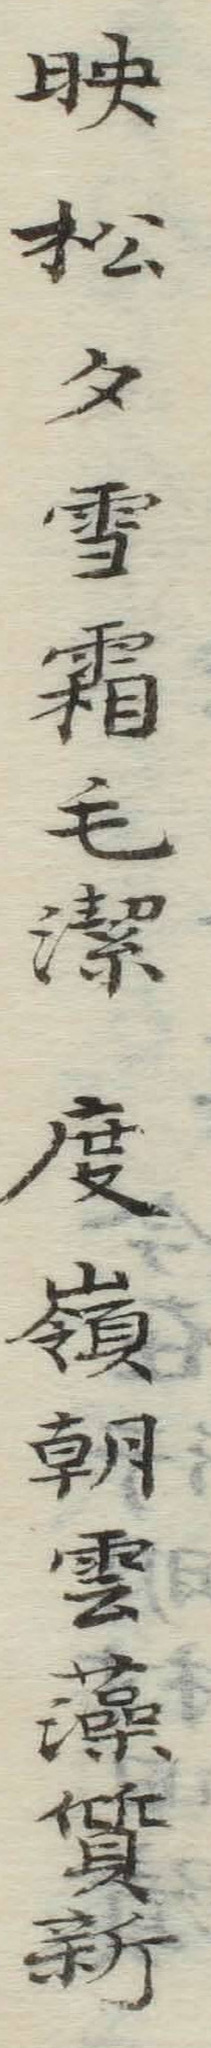映松夕雪霜毛潔度嶺朝雲藻質新
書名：三河国二葉松
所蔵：国文学研究資料館
